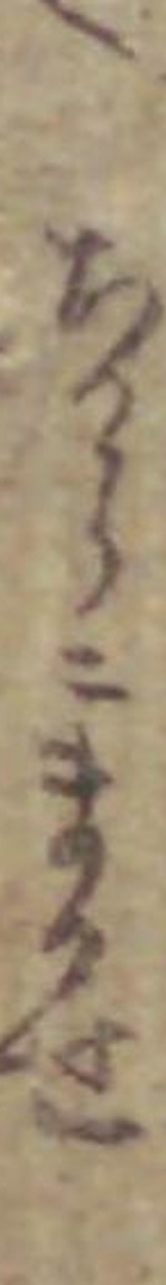ちからにまかせ
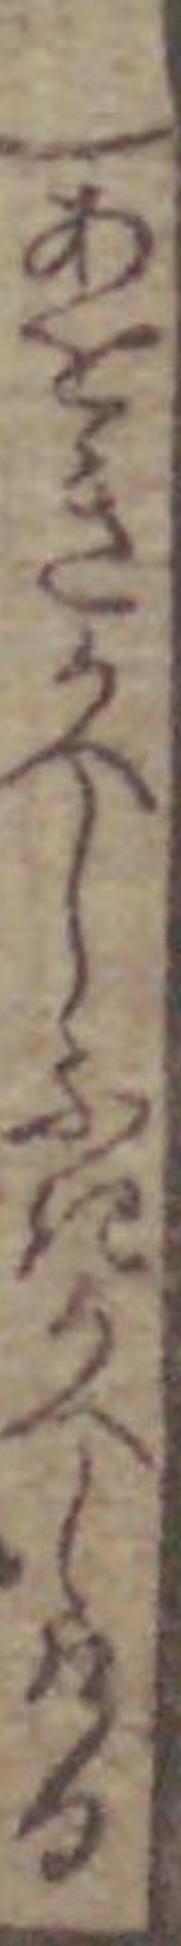あおきかへしふきかへしける
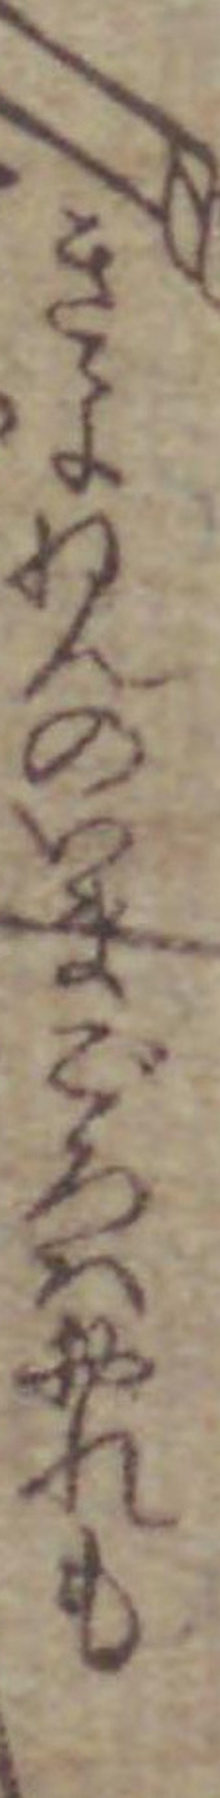きよねんのいまごろはおれも
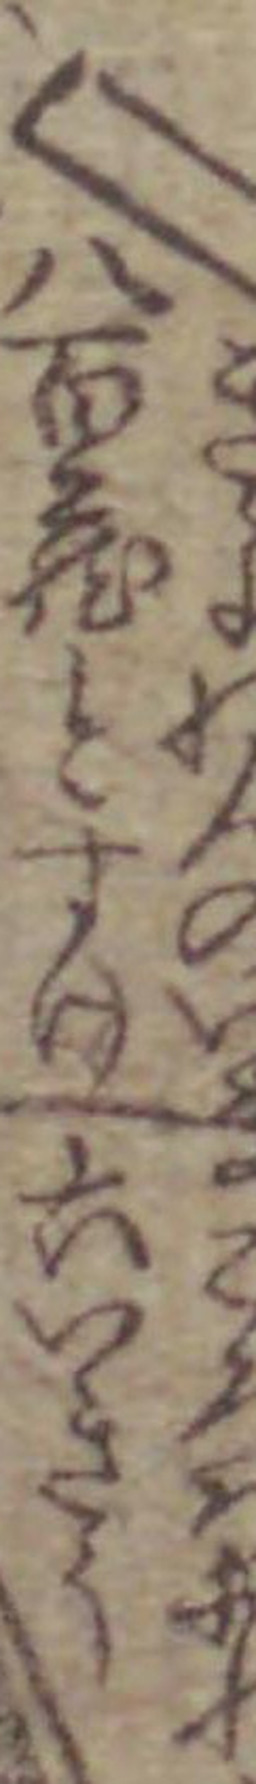八百蔵とすけ六いきう
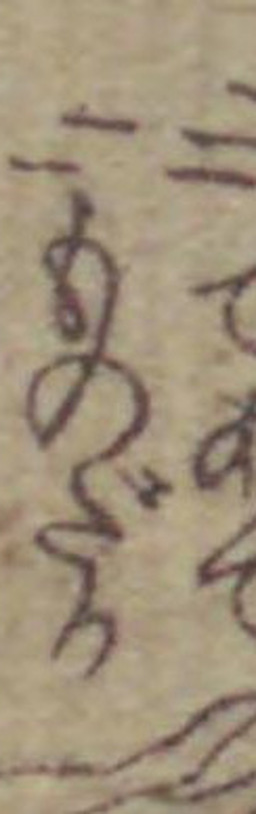ものだか
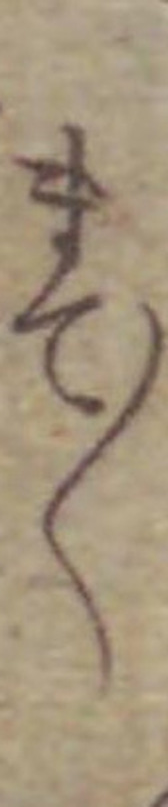まて〳〵
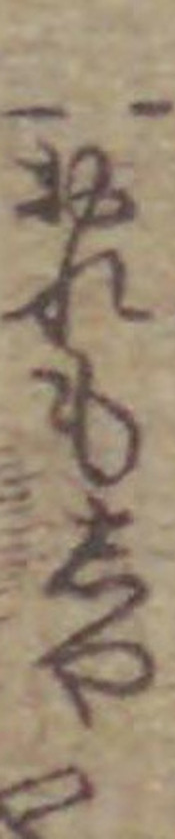おれもしや
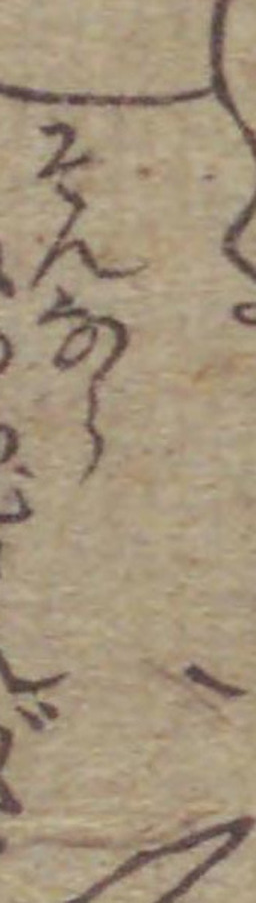そんなら
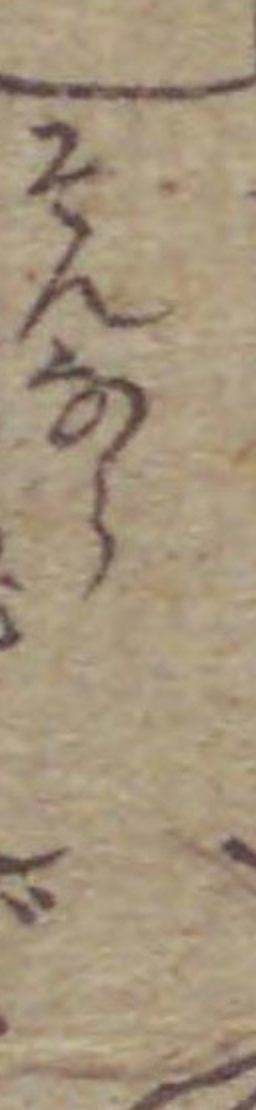そんなら
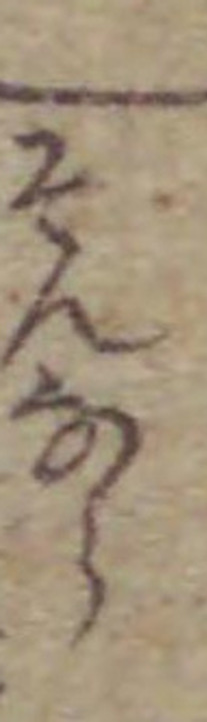そんなら
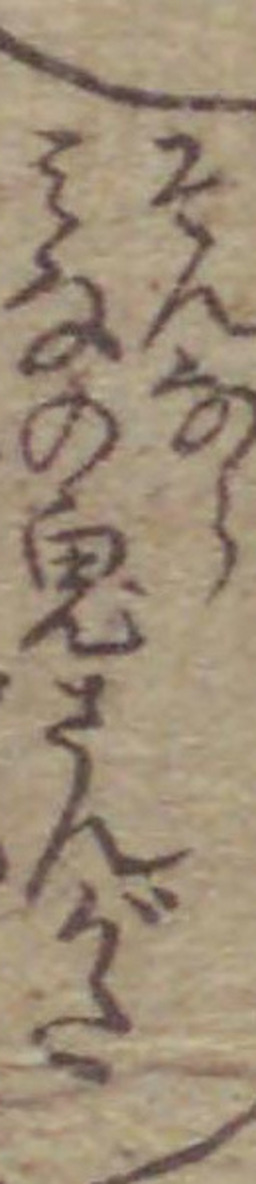みなの鬼さんがた
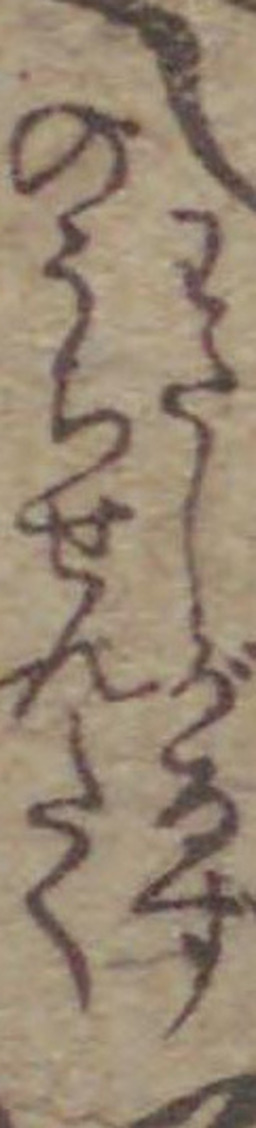のうちせんたく
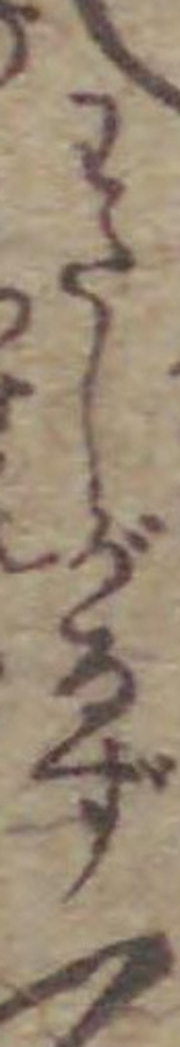わたしがるす
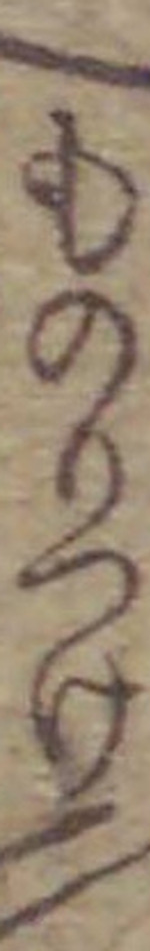ものもつけ
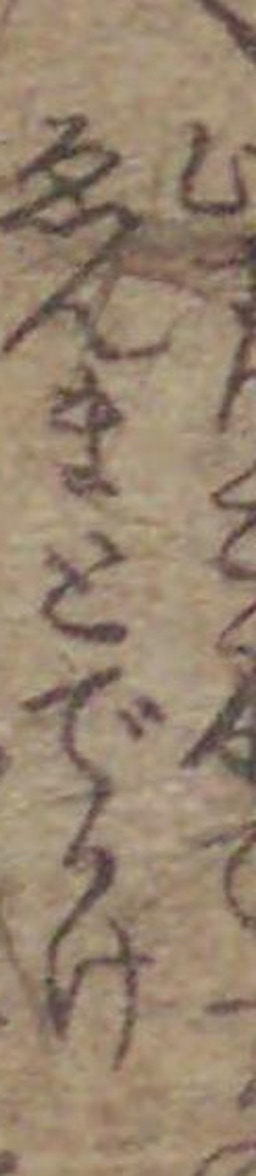ゑんまとでかけ
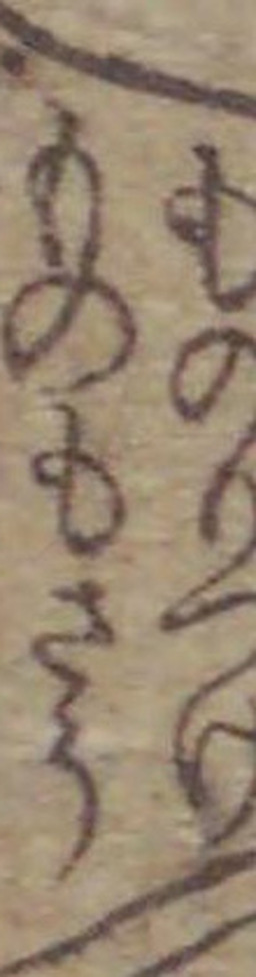ものもさう
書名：鬼の趣向草 2巻
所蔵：国立国会図書館 National Diet Library, JAPAN
